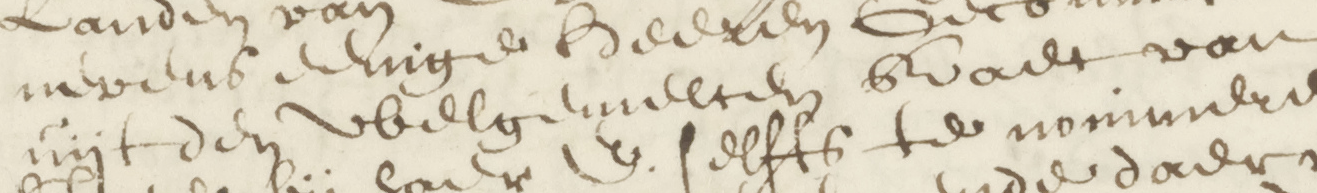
uijt den welgemelten Raet van
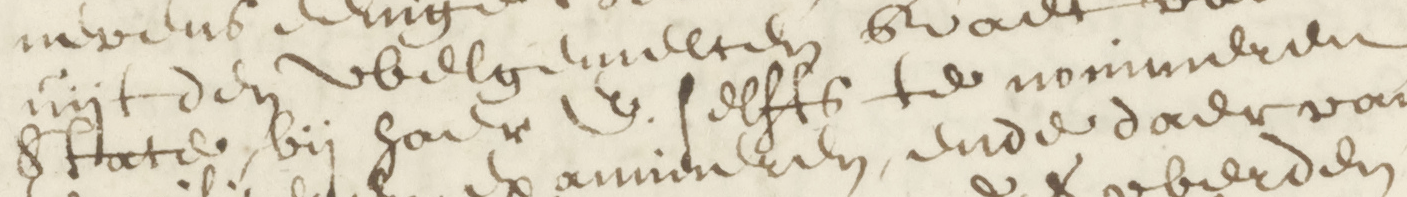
State, bij haer E. selffs te nomineren
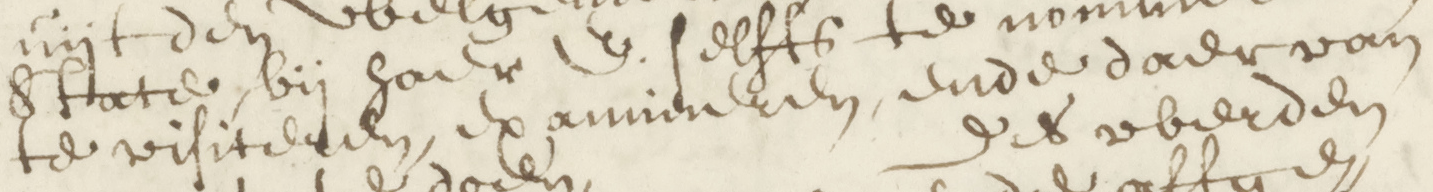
te visiteren, examieneren, ende daervan
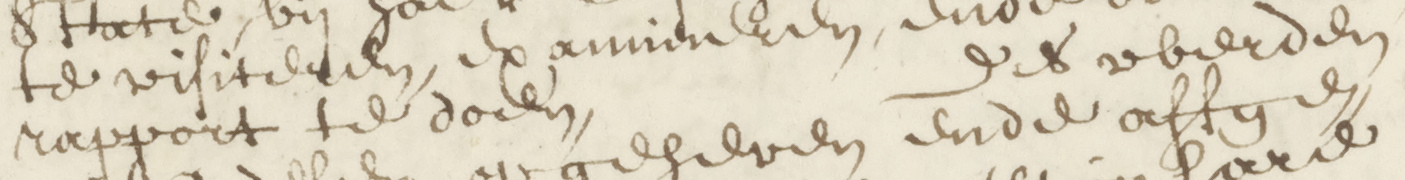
rapport te doen. Des werden
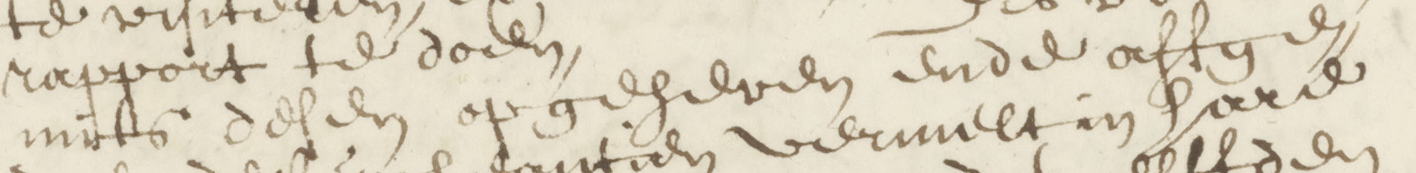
mits desen opgeheven ende affge,,
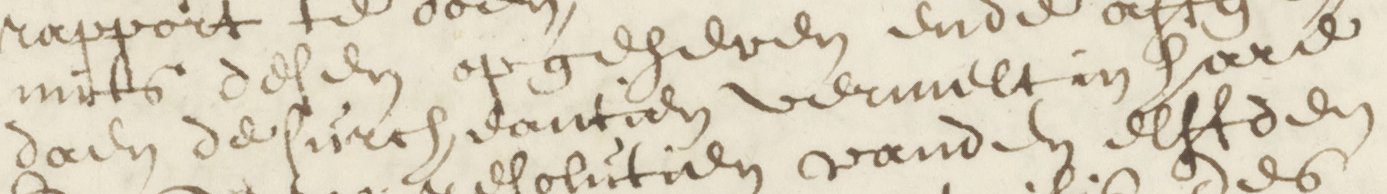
daen de surcheantien vermelt in hare
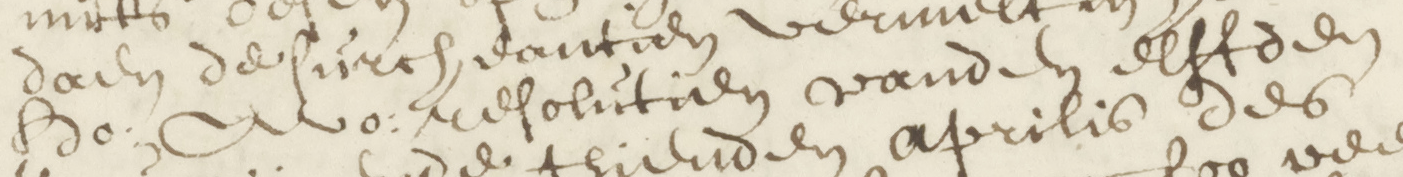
ho:Mo: resolutien vanden elffden
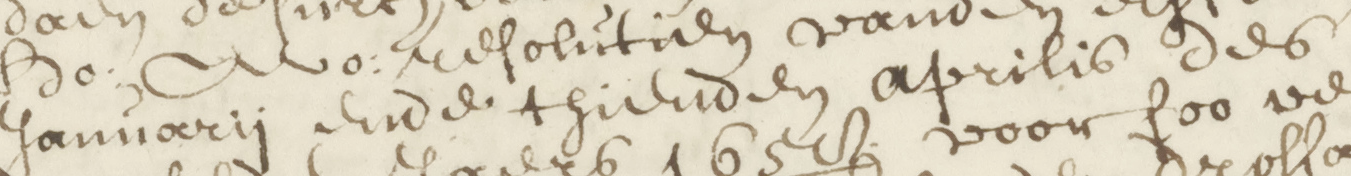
Januarij ende thienden aprilis des
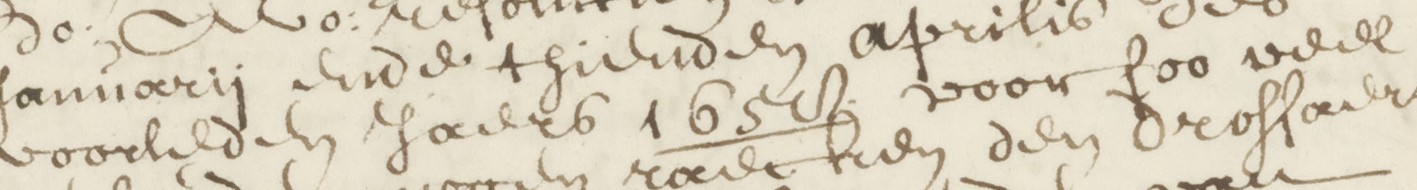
voorleden jaers 1658 voor soo veel
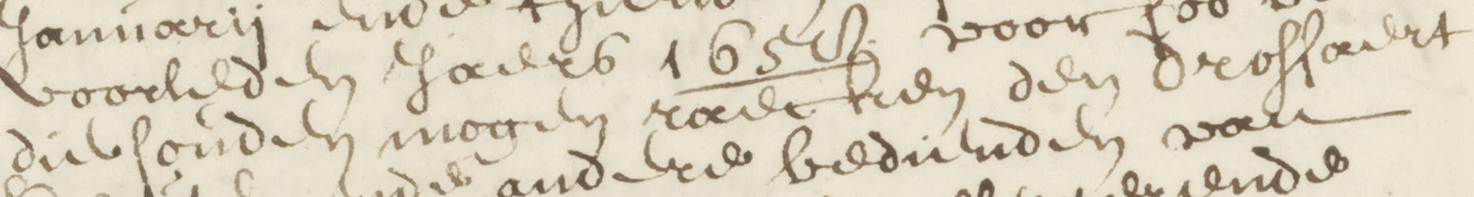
die souden mogen raecken den drossaert
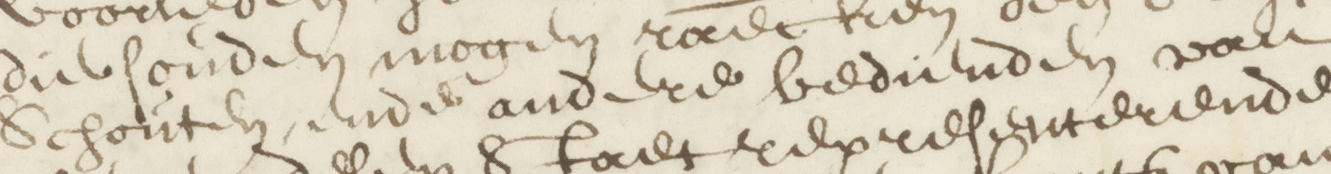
Schouten, ende andere bedienden van
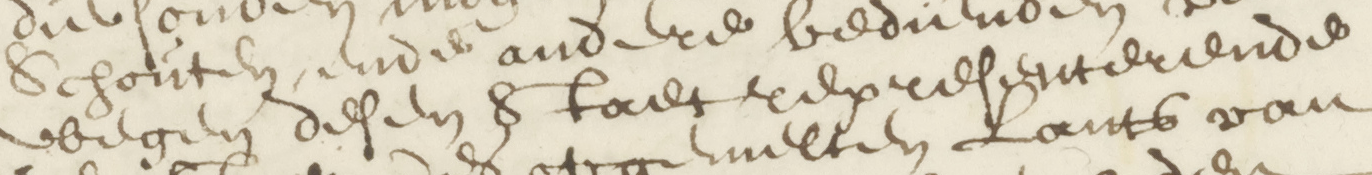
wegen desen Staet representerende
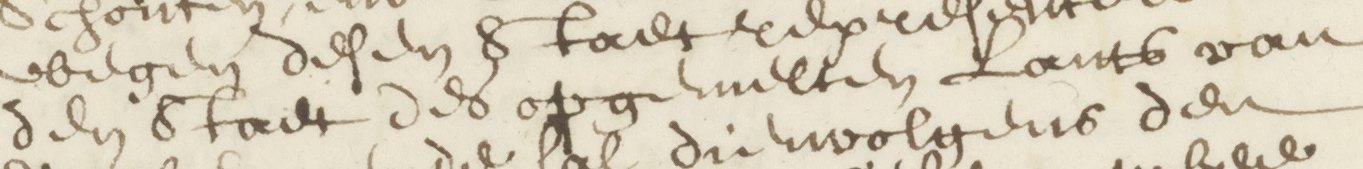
den Staet des opgemelten Lants van
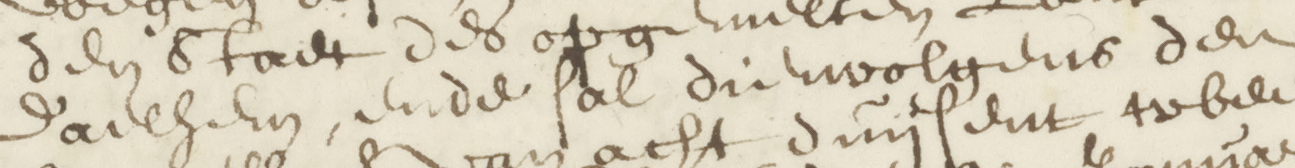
Daelhem, ende sal dienvolgens den
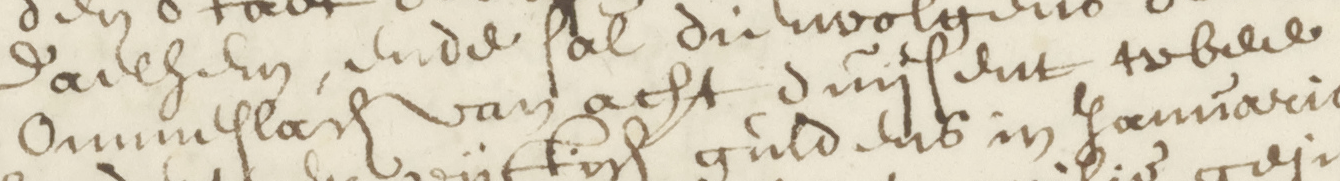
Ommeslach van acht duijsent twee
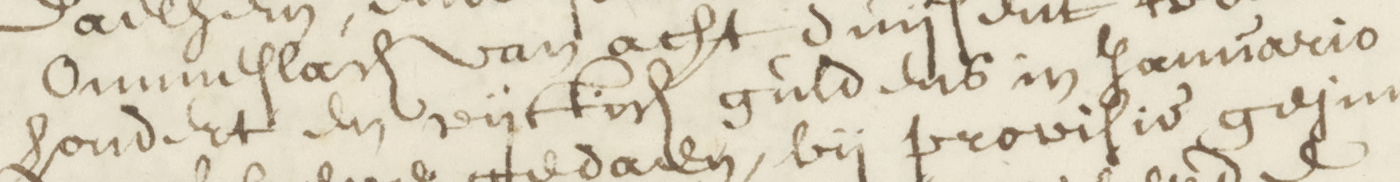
hondert en vijftich guldens in Januario
